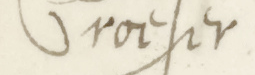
Croeser
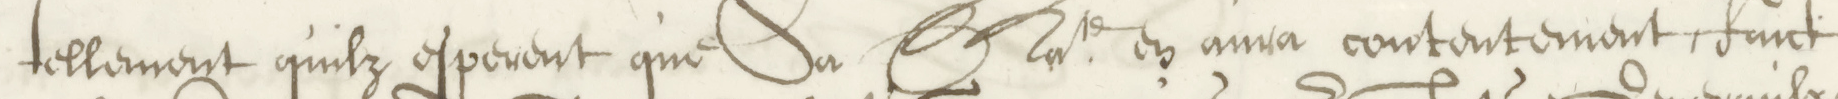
tellement quilz esperent que Sa Mate. en aura contentement, faict
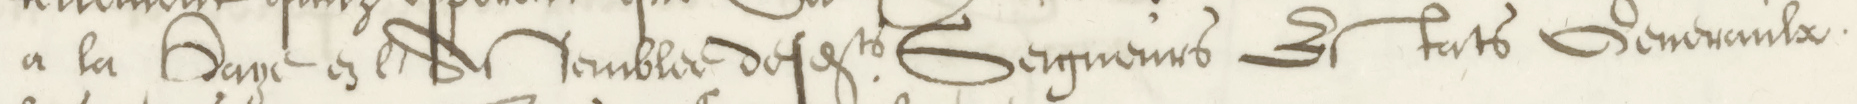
a la Haye en l'Assemblee desdts. Seigneurs Estats Generaulx
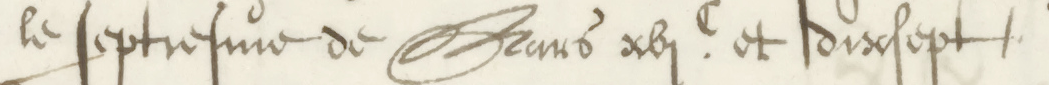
le septiesme de Mars xvic et dixsept.
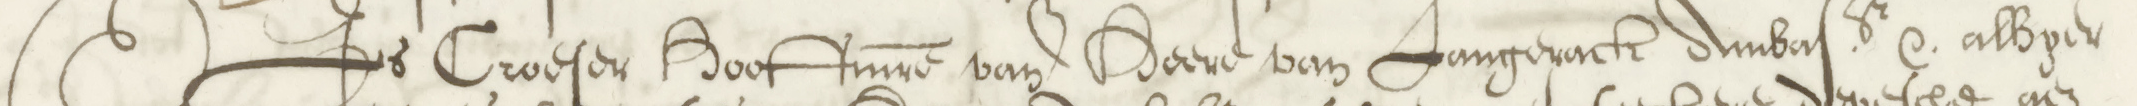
Is Croeser Hooftmre van heere van Langerack Ambasr. alhyer
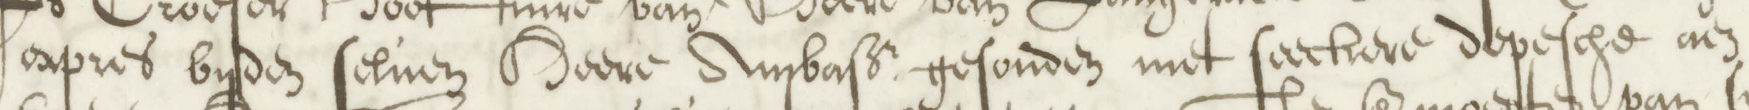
expres byden seluen Heere Ambasr. gesonden met seeckere depesche aen
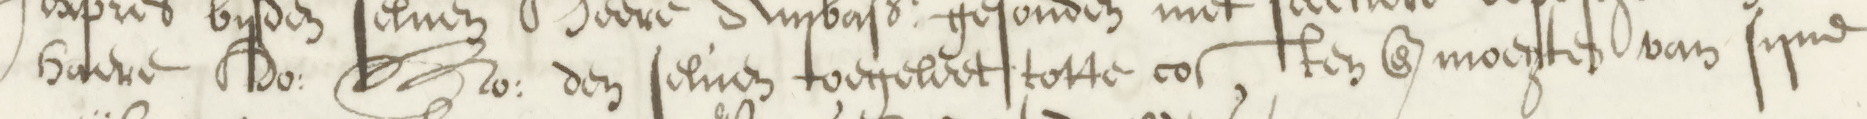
haere Ho:Mo: den seluen toegeleet totte costen & moeyten van syne
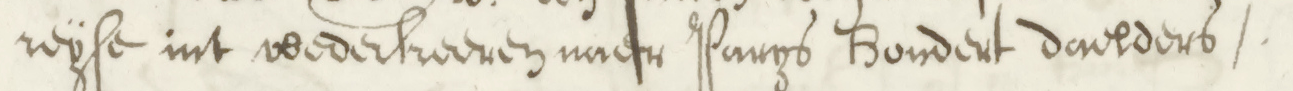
reijse int wederkeeren naer Parys hondert daelders.
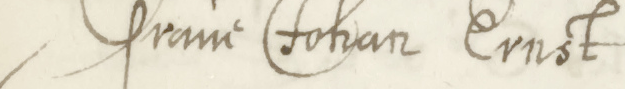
Graue Johan Ernst
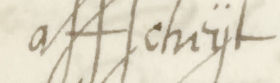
affscheijt
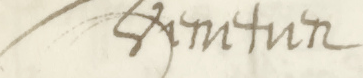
Venetien
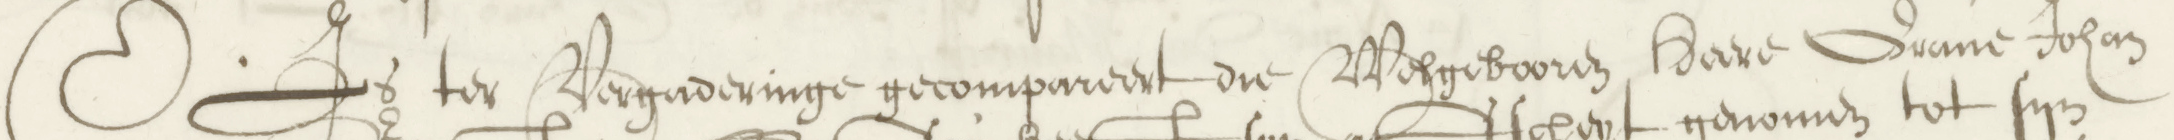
Is ter vergaderinge gecompareert die Welgebooren heere Graue Johan
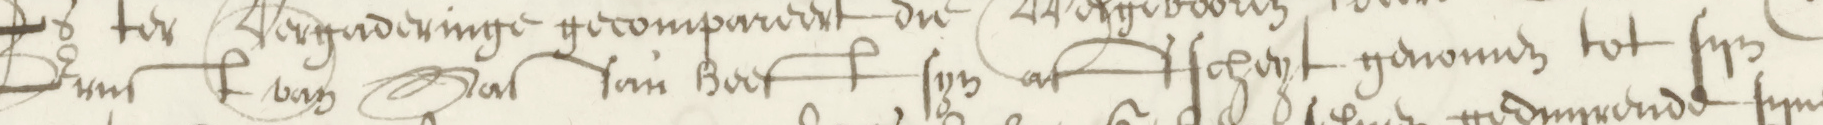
Ernst van Nassau heeft syn affscheyt genomen tot syn
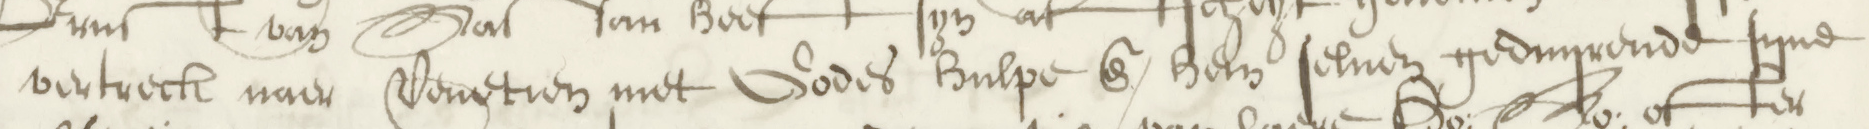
vertreck naer Venetien met Godes hulpe & hem seluen geduyrende syne
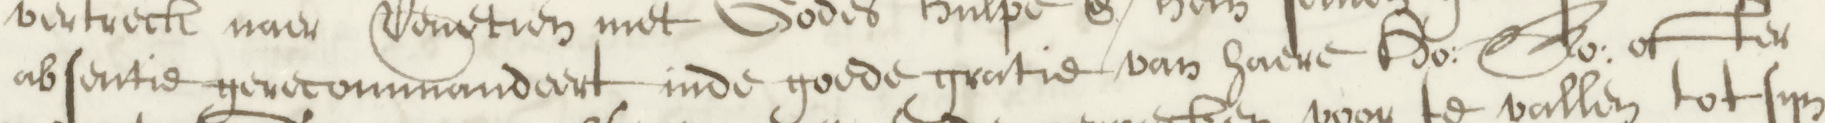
absentie gerecommandeert inde goede gratie van haere Ho:Mo: offer
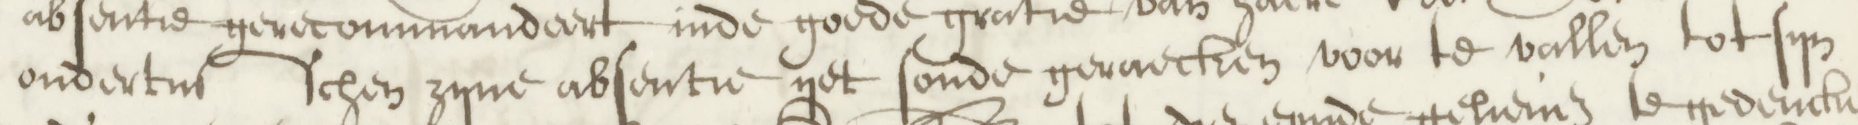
ondertusschen zyne absentie yet soude geraecken voor te vallen tot syn
